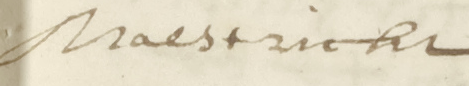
Maestricht
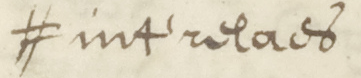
# int'relaes
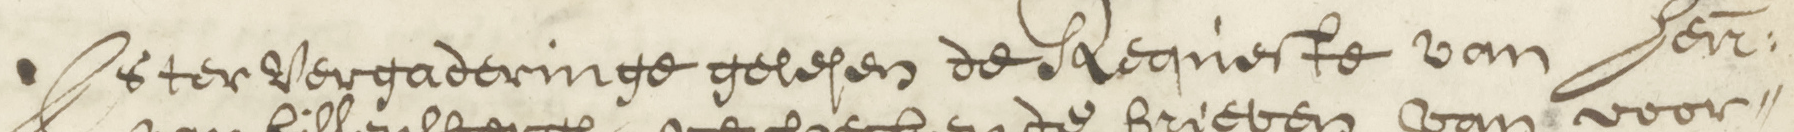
Is ter Vergaderinge gelesen de Requeste van Henr:
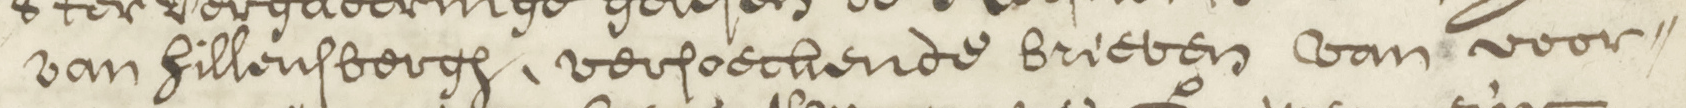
van Hillensbergh, versoeckende brieven van voor„
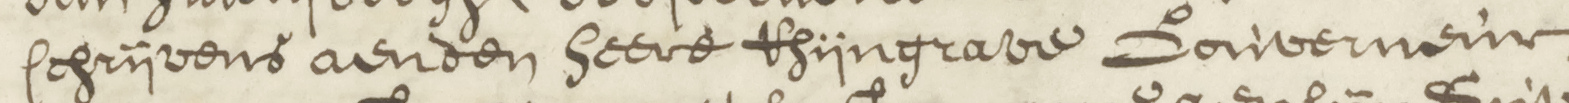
schrijvens aenden heere Rhijngrave Gouverneur
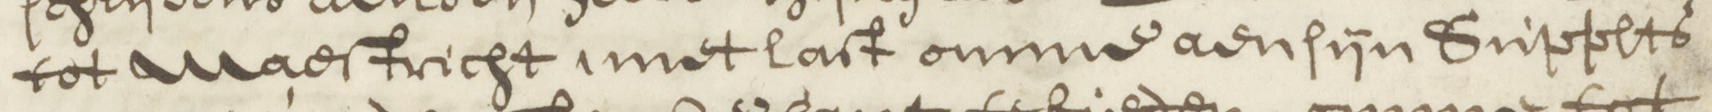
tot Maestricht met last omme aen sijn Supplts
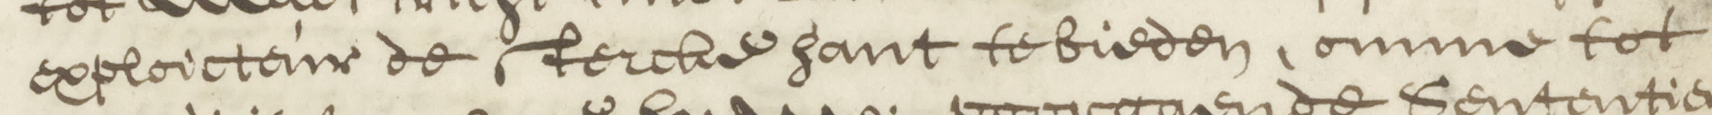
exploicteur de stercke hant te bieden, omme tot
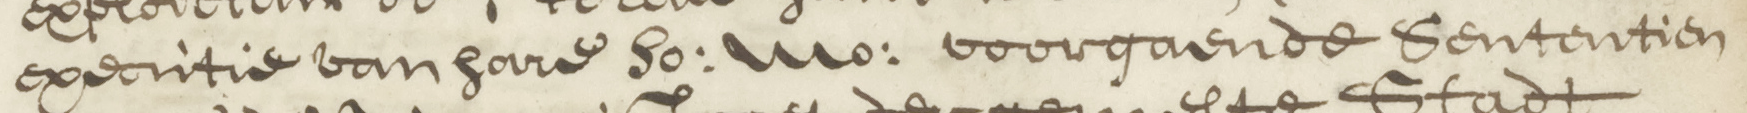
executie van hare Ho:Mo: voorgaende Sententien
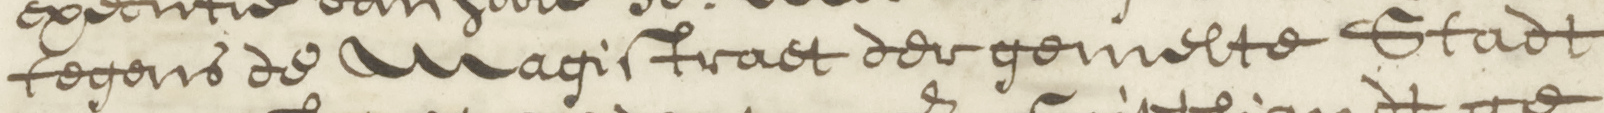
tegens de Magistraet der gemelte Stadt
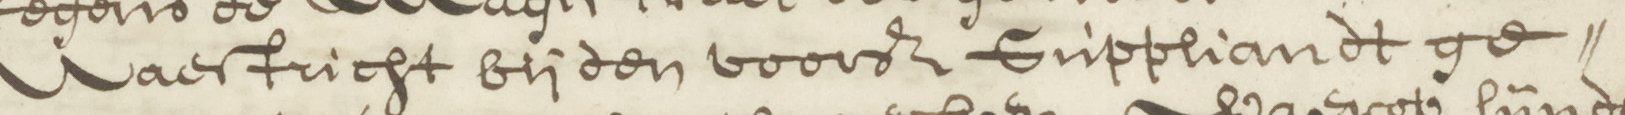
Maestricht bij den voors Suppliandt ge,,
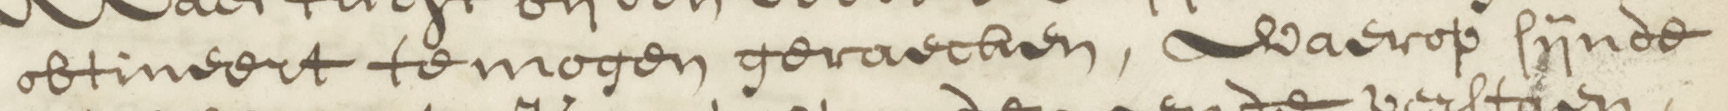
obtineert te mogen geraecken. Waerop sijnde
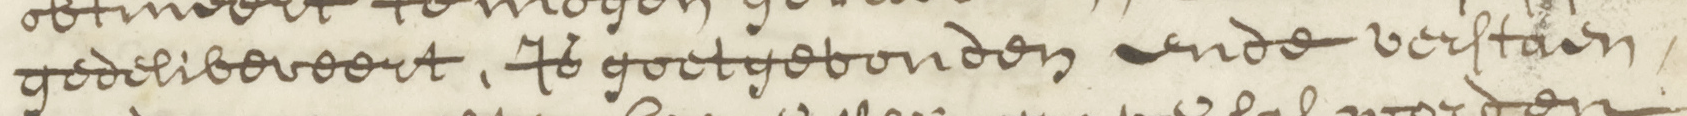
gedelibereert, Is goetgevonden ende verstaen,
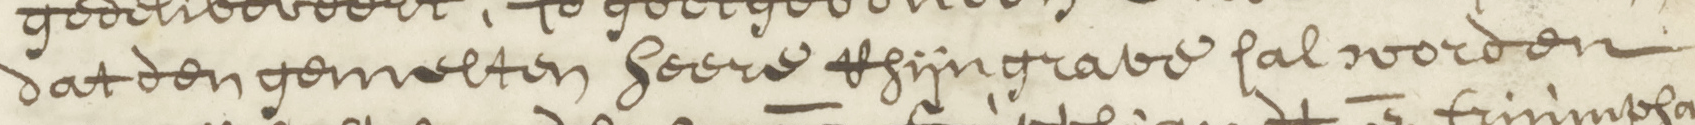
dat den gemelten heere Rhijngrave sal worden
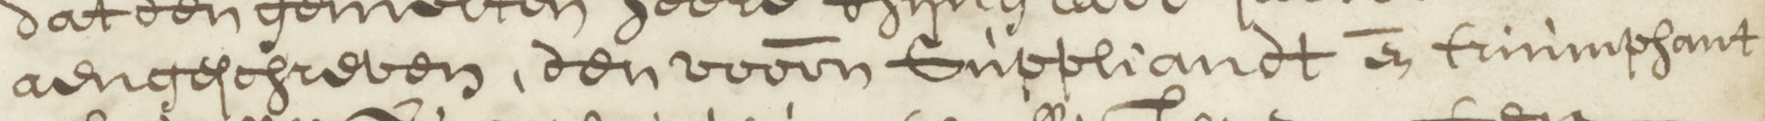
aengeschreven, den voorn. Suppliandt en triumphant
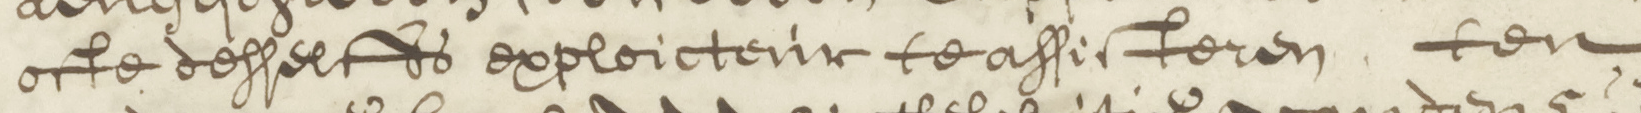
ofte desselffs exploicteur te assisteren, ten
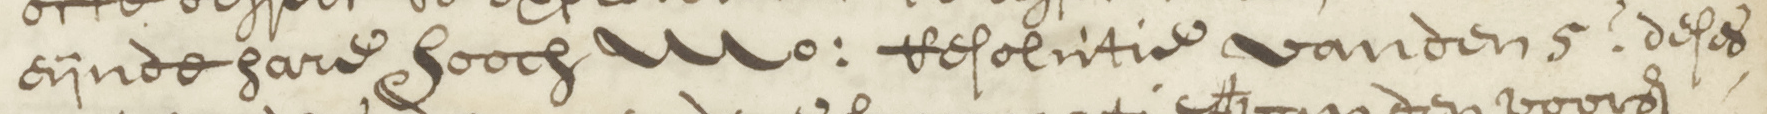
eijnde hare Hooch Mo: Resolutie vanden 5e. deses
